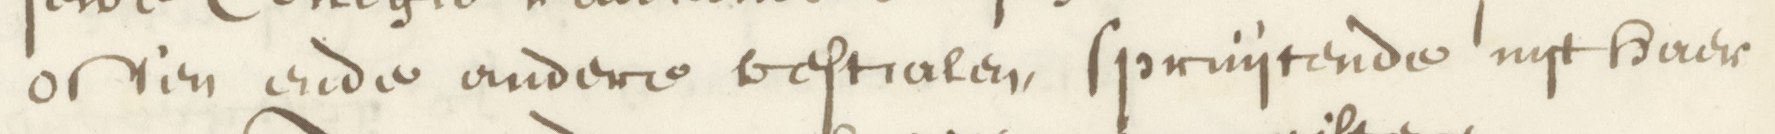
ossen ende andere bestialen, spruijtende uyt Haer
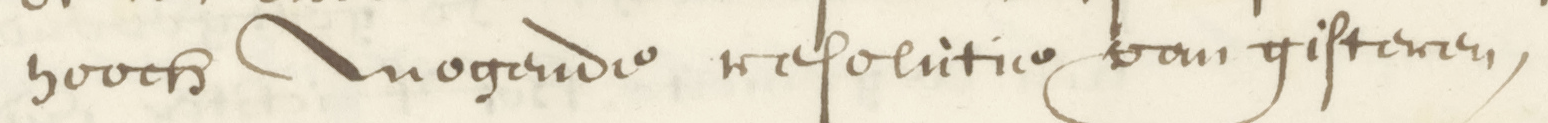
hooch Mogende resolutie van gisteren.
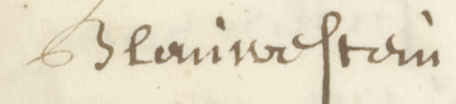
Blauwestein
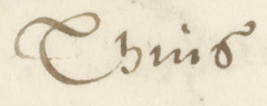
Thins
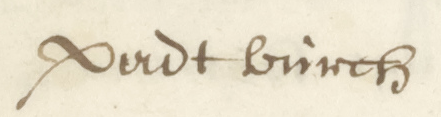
Padtburch
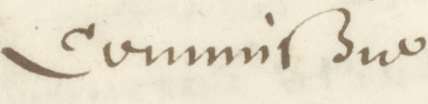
Commissie
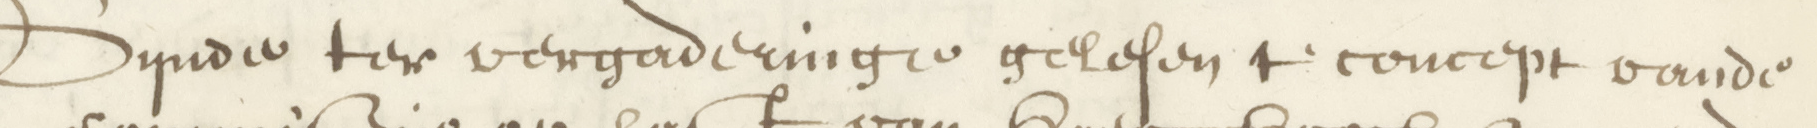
Synde ter vergaderinge gelesen t'concept vande
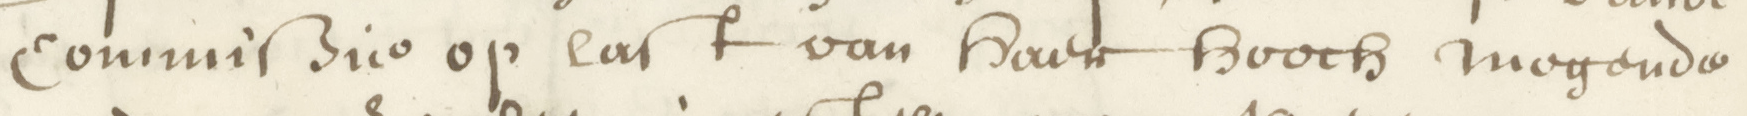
Commissie op last van Haer Hooch Mogende
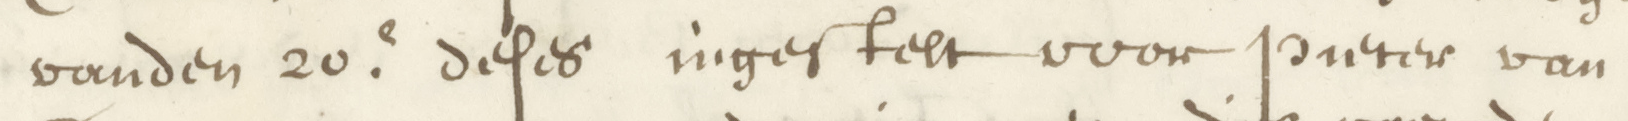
vanden 20e. deses ingestelt voor Pieter van
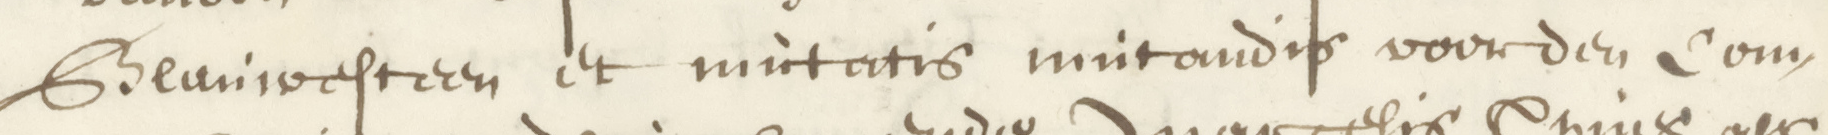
Blauwesteen et mutatis mutandis voor den Com„
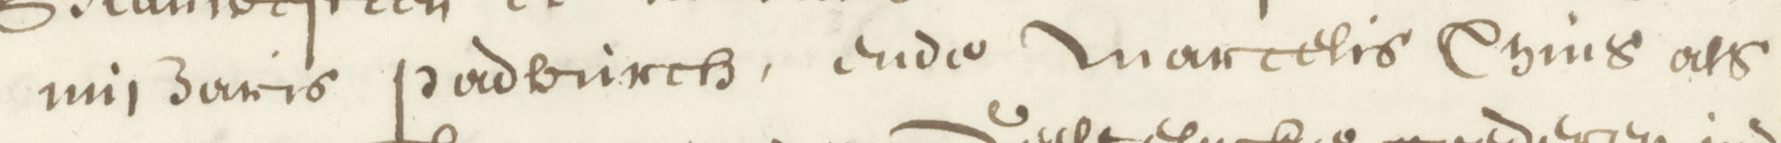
missaris Padburch, ende Marcelis Thins als
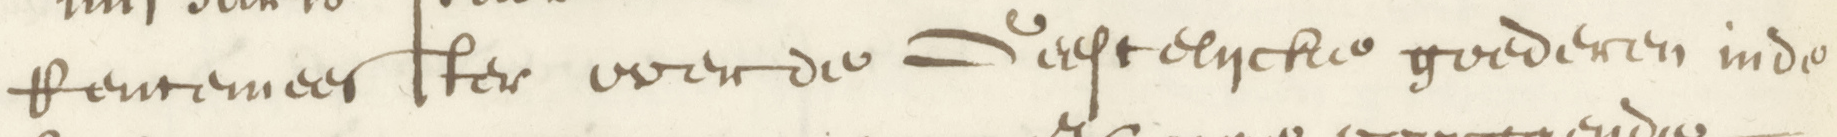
Rentemeester over de Geestelycke goederen inde
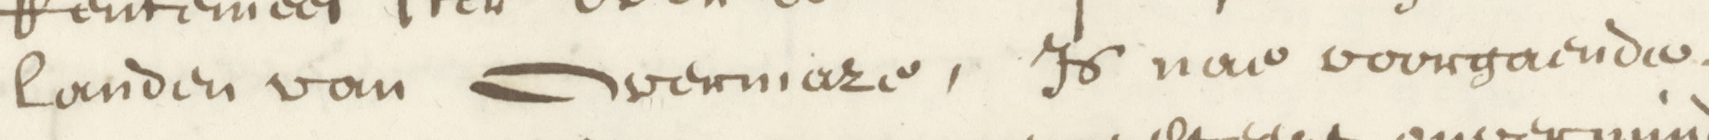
Landen van Overmaze. Is nae voorgaende
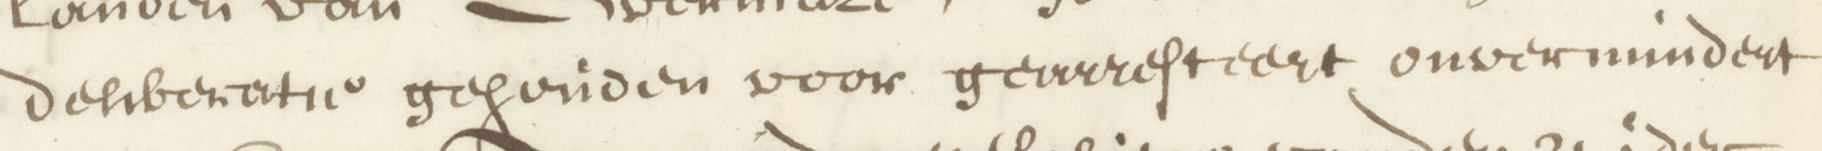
deliberatie gehouden voor gearresteert onvermindert
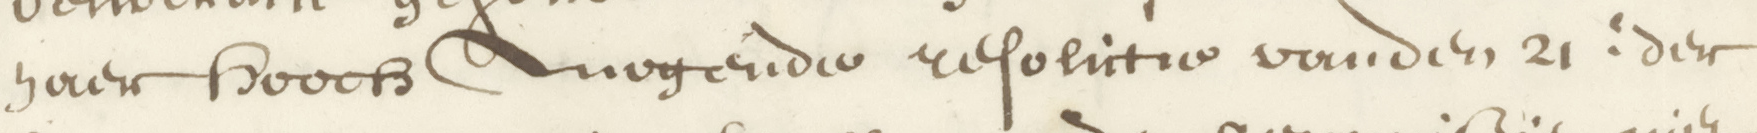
haer Hooch Mogende resolutie vanden 21e. der
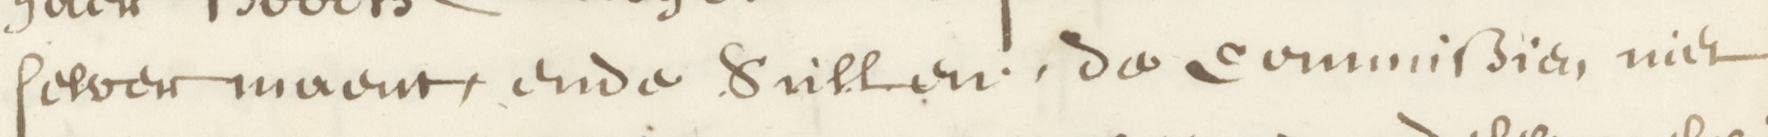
selver maent, ende Sullen, de Commissien niet
